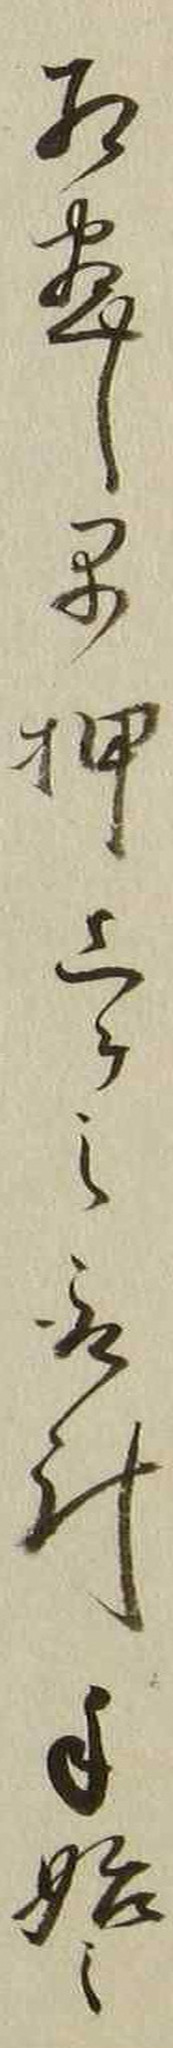相尽し早押上ケ之取計手始之
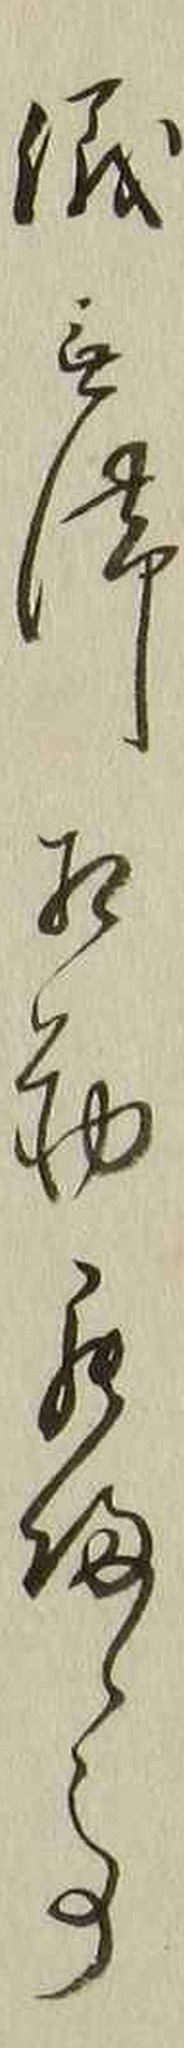儀無滞相勤罷帰候事
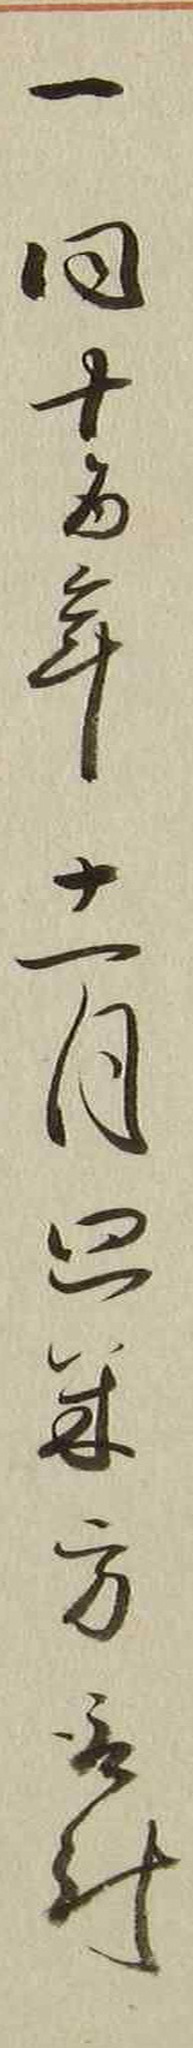一同十酉年十一月廻米方取計
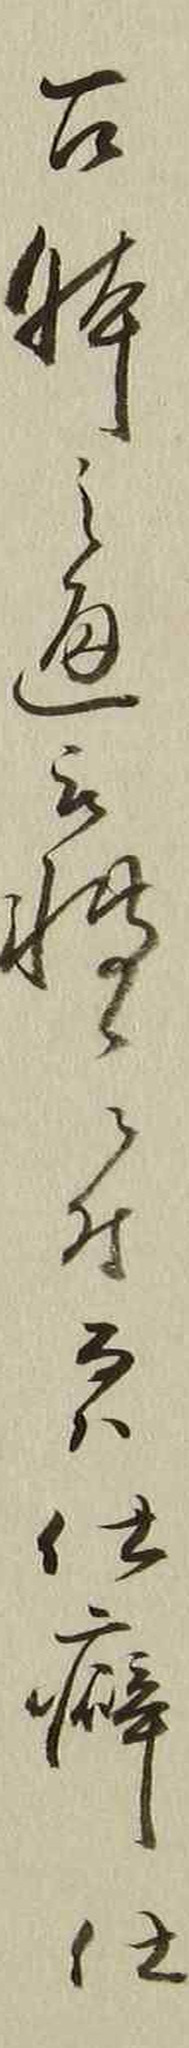右躰之通被転候ニ付而ハ仕癖仕
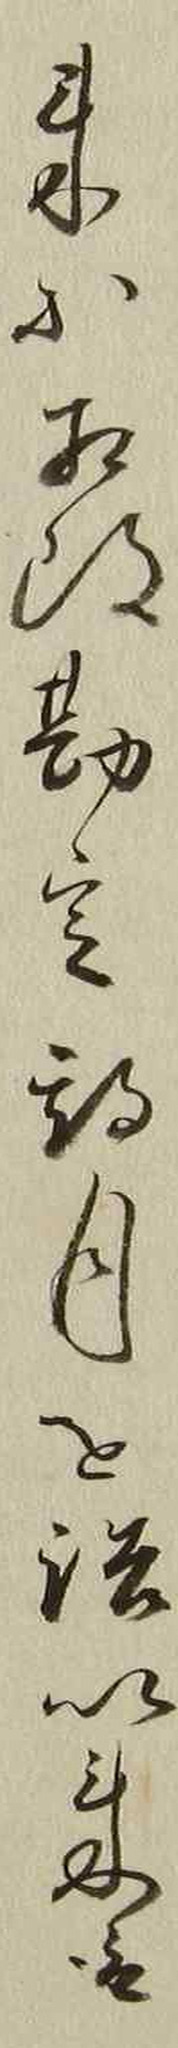来に相改勘定期月を詰以来取
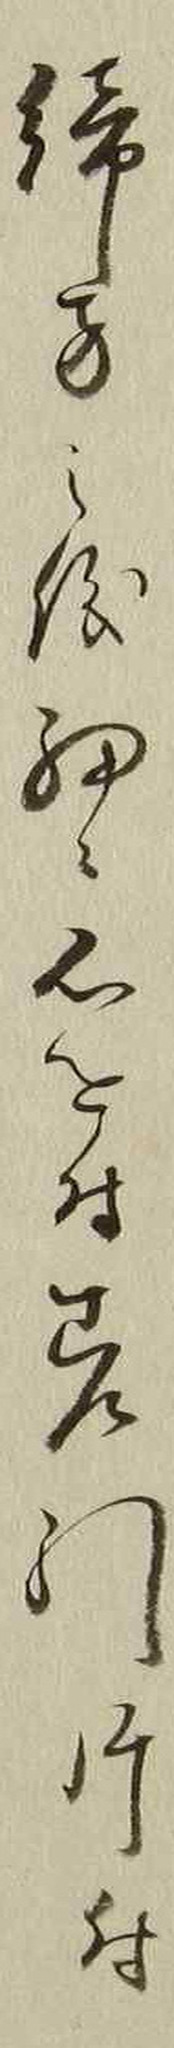締方之儀細々心を付差引片付
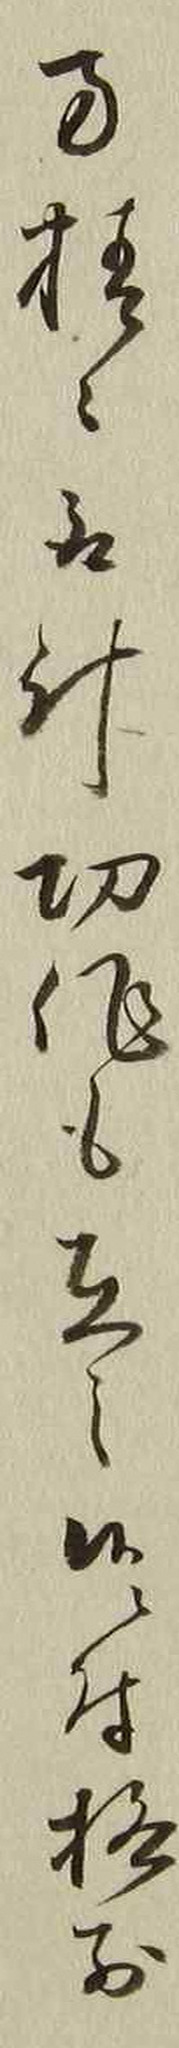方精々取計功作も在之候ニ付格別
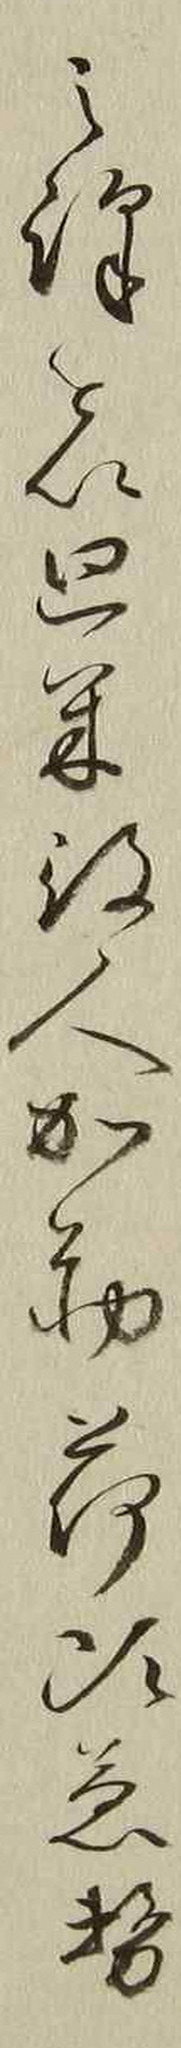之訳を以廻米役人加勤荷頭兼務
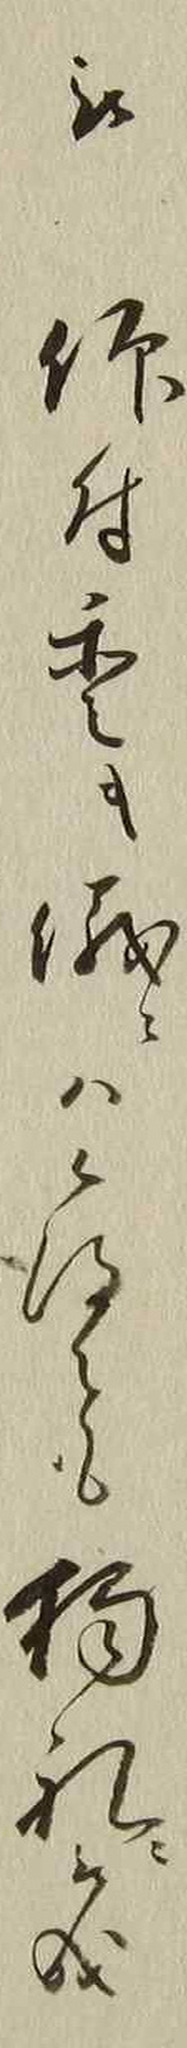被仰付キ儀ニハ候得とも独礼ニ被成
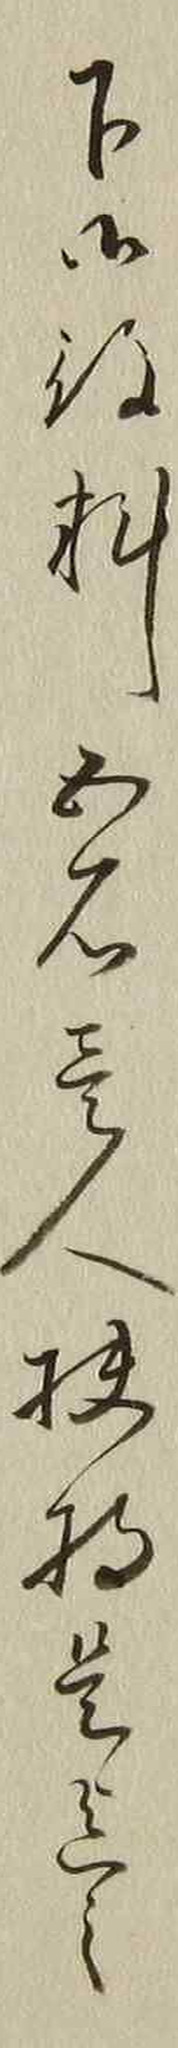下御役料五石壱人扶持是迄之
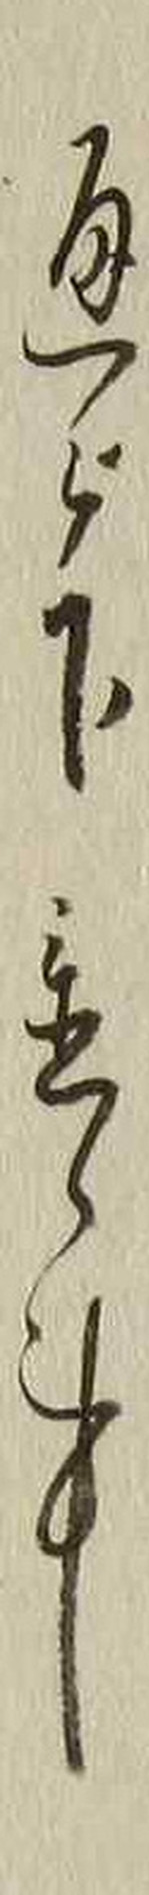通被下置候事
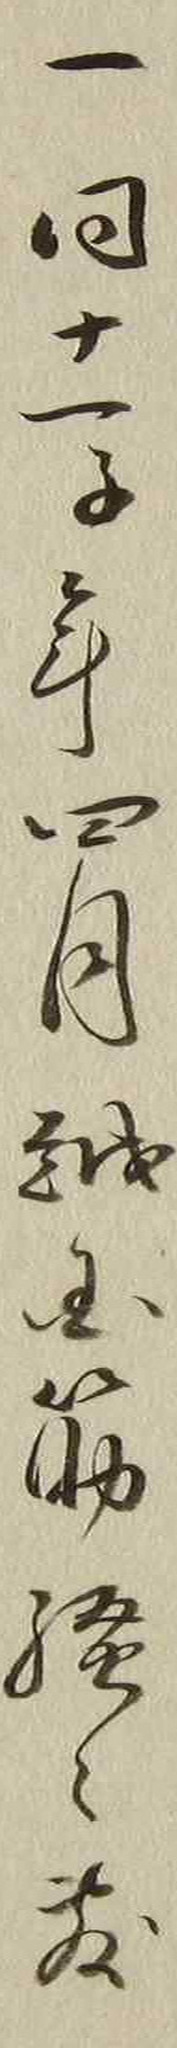一同十一子年四月越国筋騒々敷
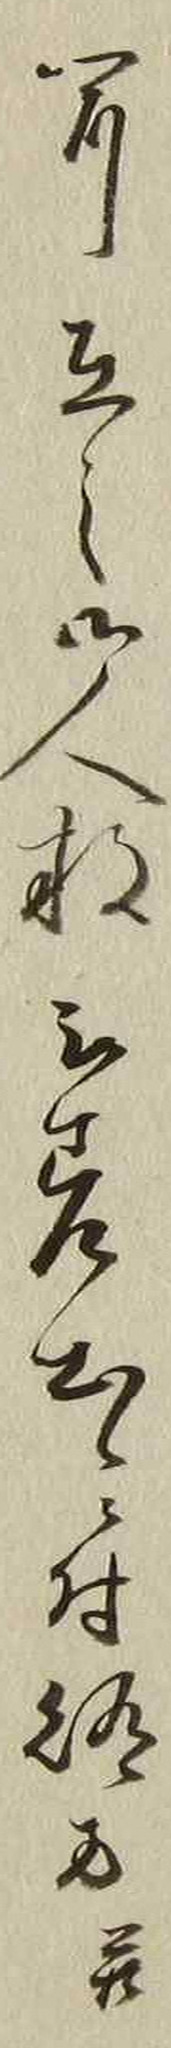聞在之御人数被差出候ニ付賄方幷
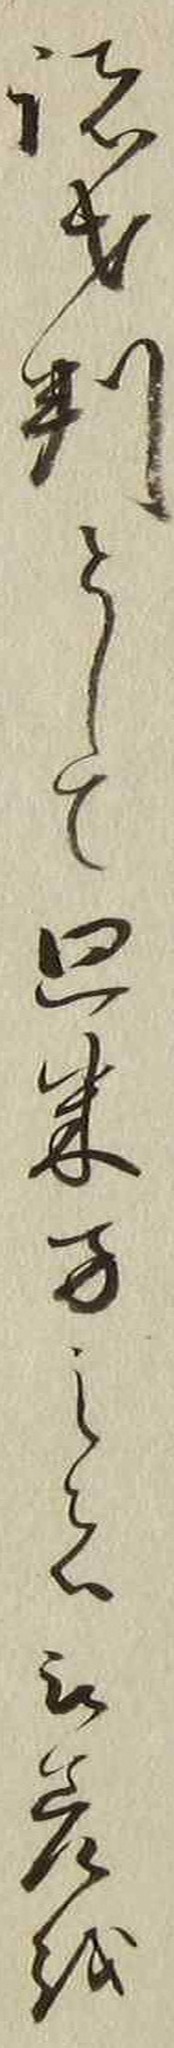諸才判として廻米方之者被差越
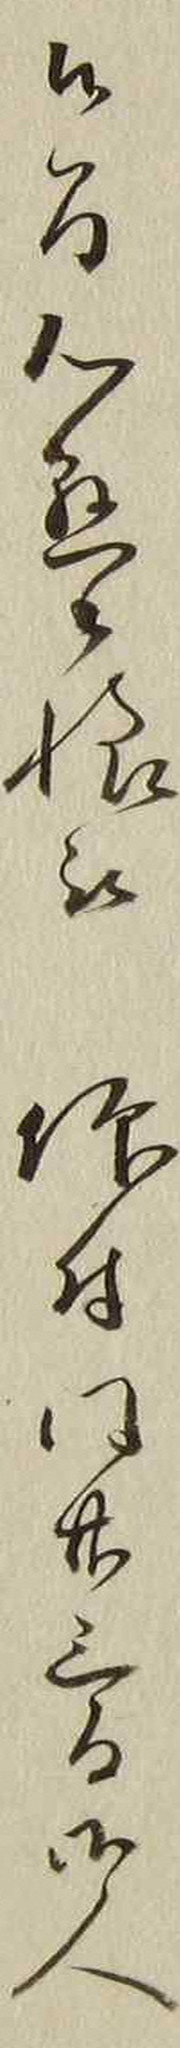候間心懸候様被仰付同廿三日御人
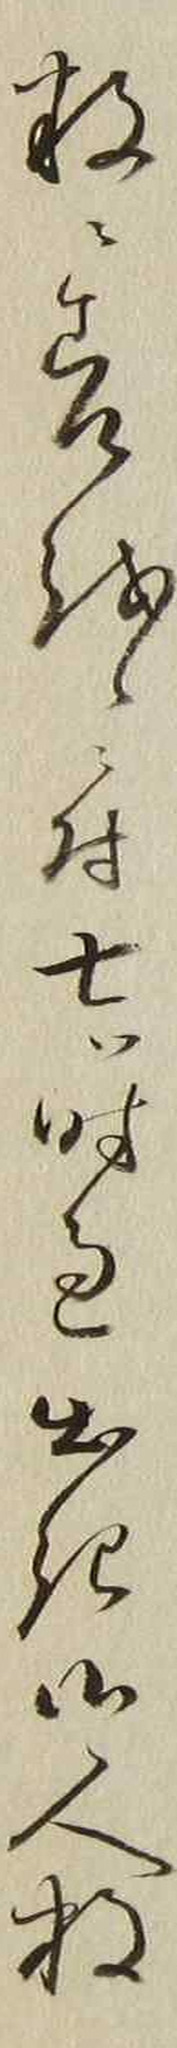数ニ差越候ニ付七ツ時過出起御人数
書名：諸士系譜　巻之52　に之部3
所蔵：会津若松市立会津図書館
